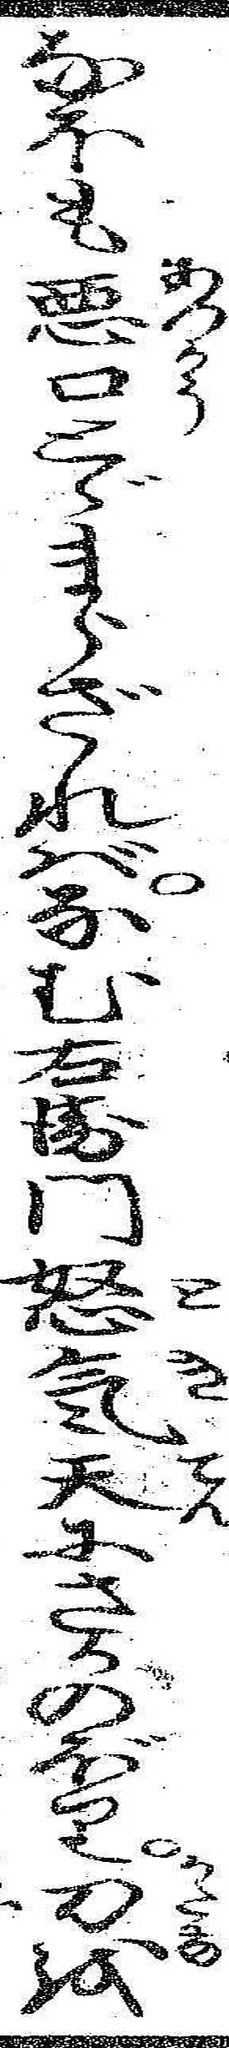なほも悪口とゞまらざれば。なむ右衛門怒気天にさかのぼり。刀を
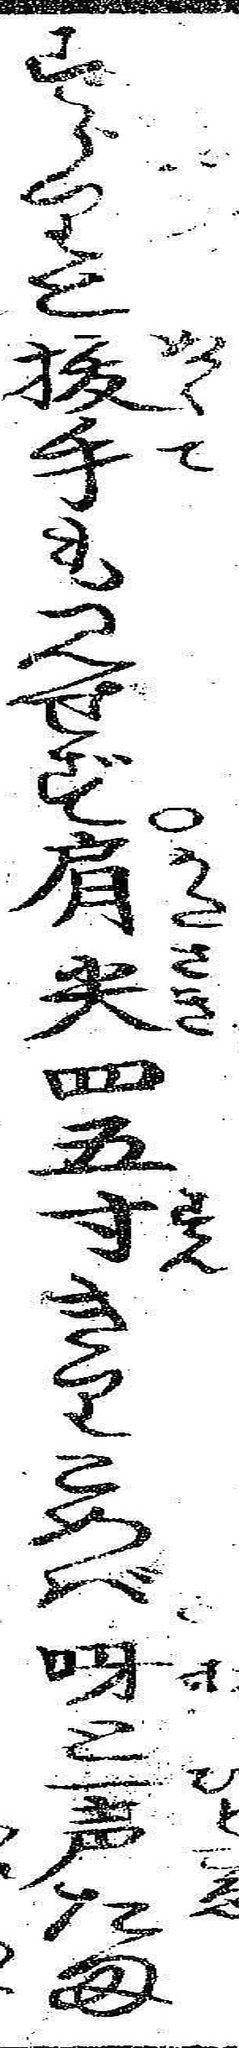すらりと抜手も見せず。肩尖四五寸きりこめば。呀と一声たま
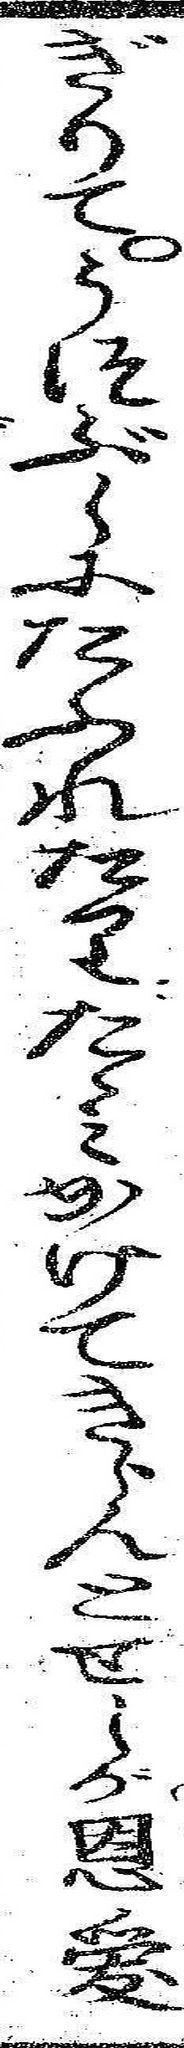ぎりて。うつぶしにたふれたり。たゝみかけてきらんとせしが。恩愛
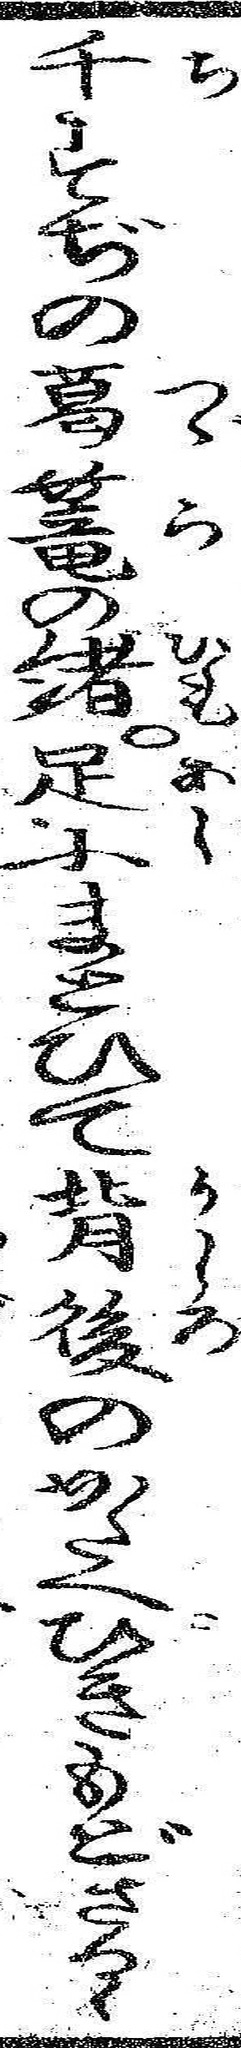千すぢの葛篭の緒。足にまとひて背後のかたへ。ひきもどさるゝ
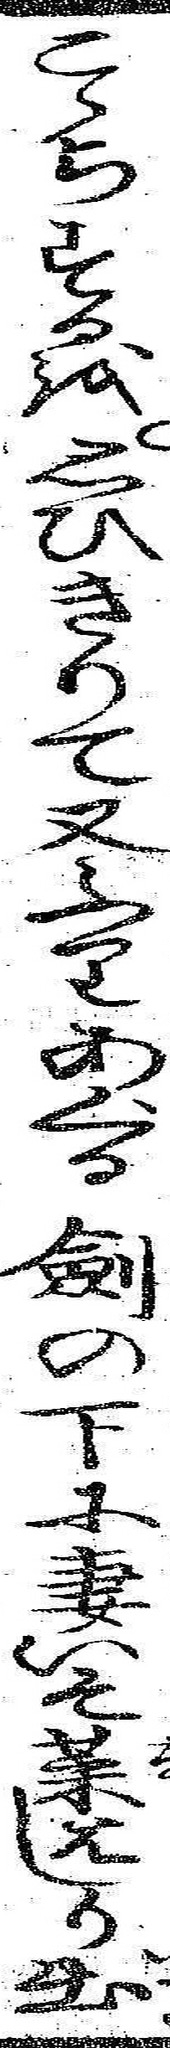こゝちするを。思ひきりて又ふりあぐる剣の下に。妻いそ菜はしり出。

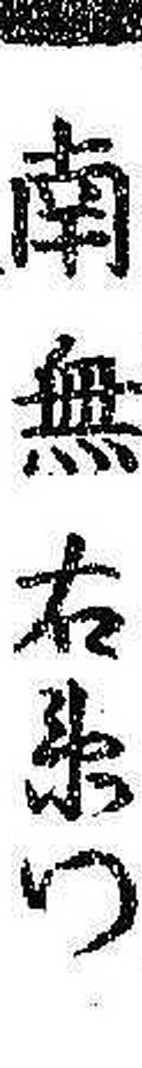南無右衛門
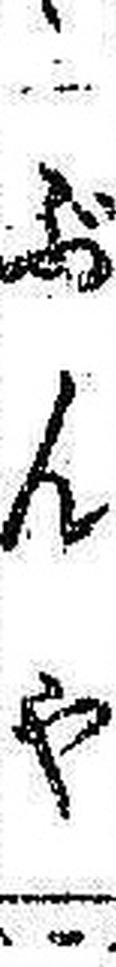ぶんや
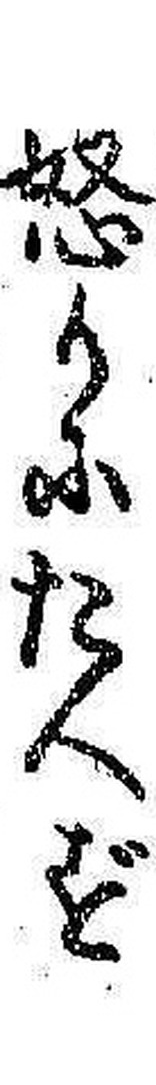怒りにたへず
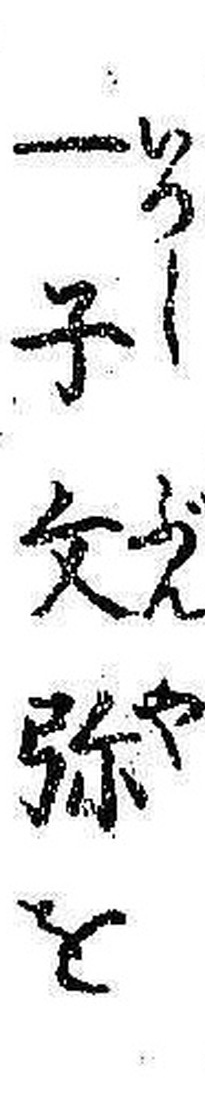一子文弥を
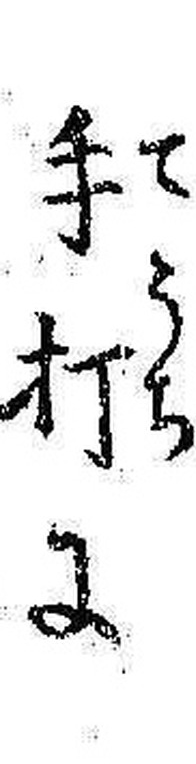手打に
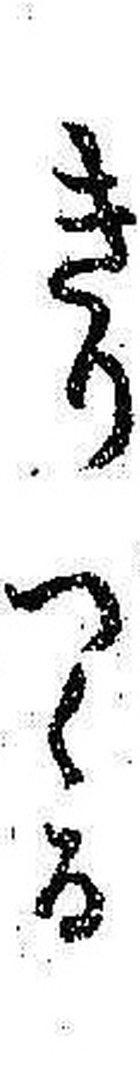きりつくる
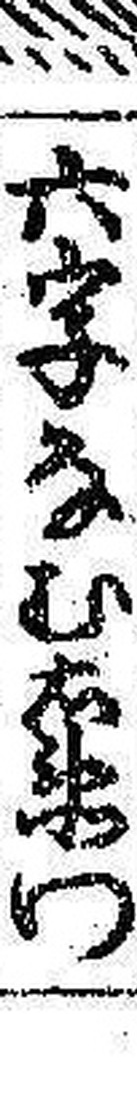六字なむ右衛門

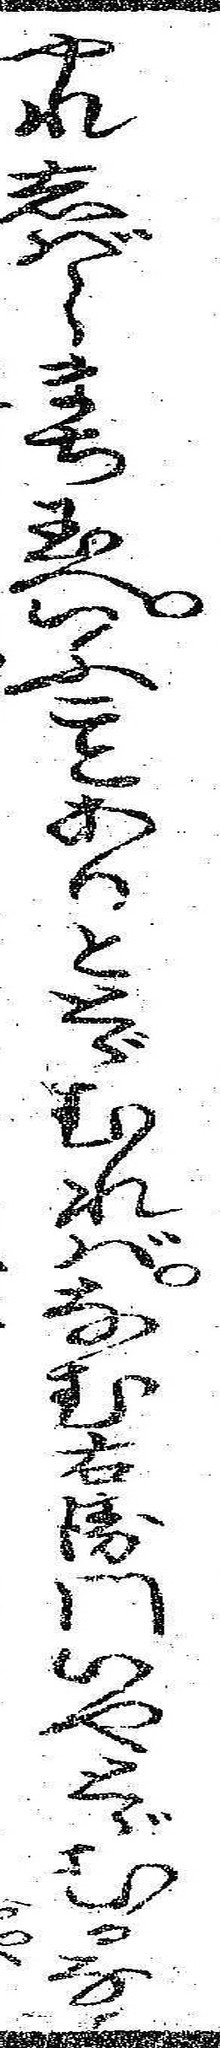やれしばしまち玉へ。いふことありととゞむれば。なむ右衛門いやとゞむるな
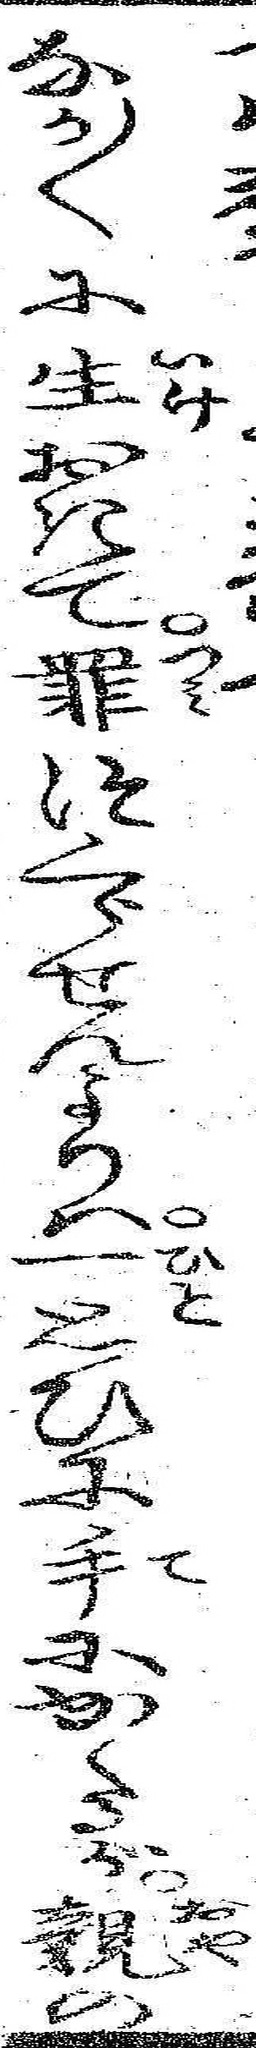なか〳〵に生おきて。罪つくらせんよりは。一思ひに手にかくるが。親の
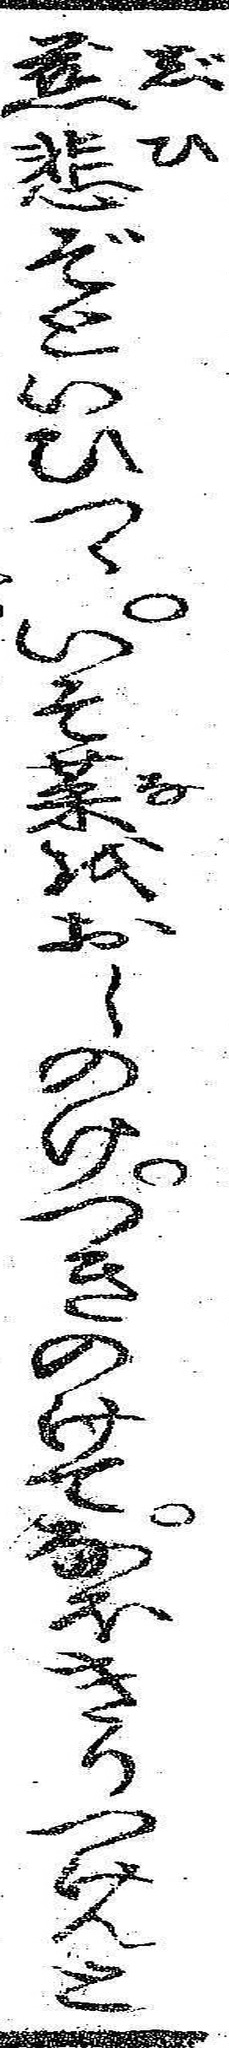慈悲ぞといひつゝ。いそ菜をおしのけ。つきのけて。なほきりつけんと
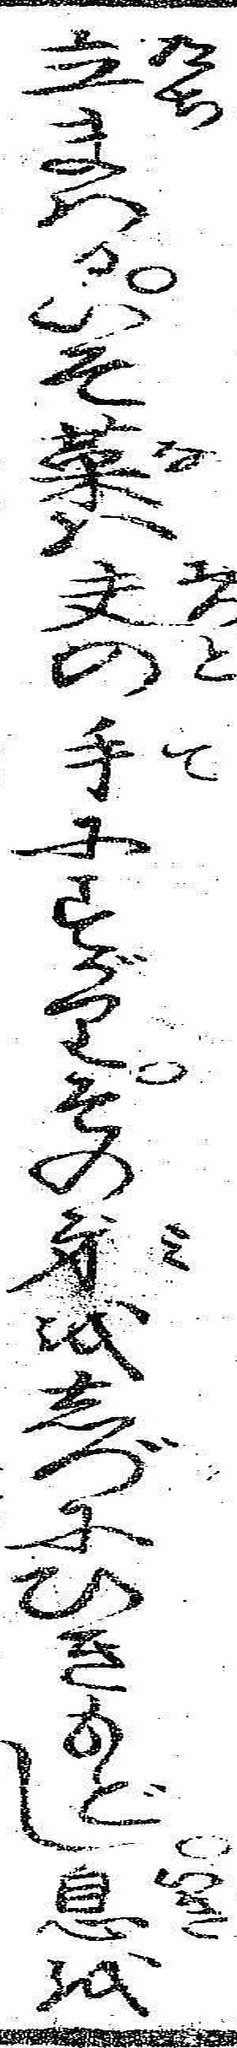立まはる。いそ菜は夫の手にすがり。その身をしづにひきもどし。息を
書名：昔話稲妻表紙
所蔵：国文学研究資料館
